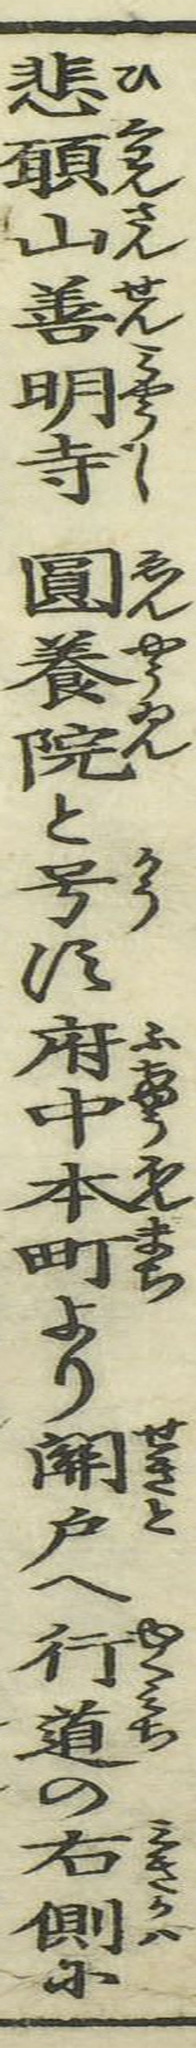悲願山善明寺圓養院と号す府中本町より関戸へ行道の右側に
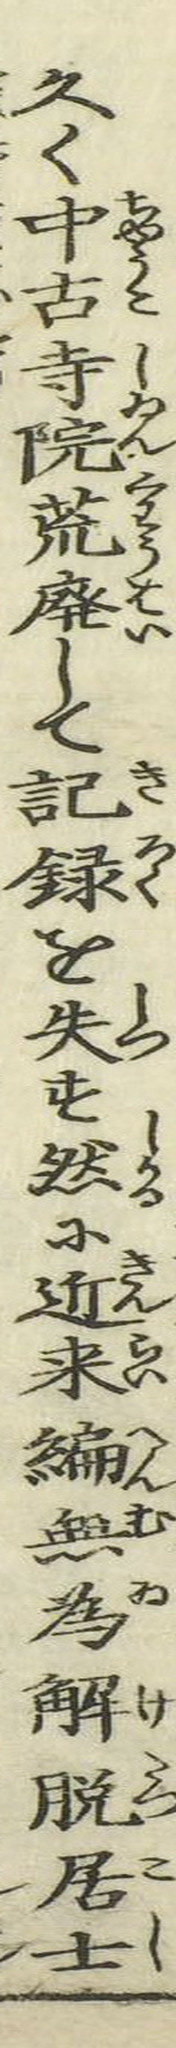久く中古寺院荒廃して記録を失す然に近来編無為解脱居士
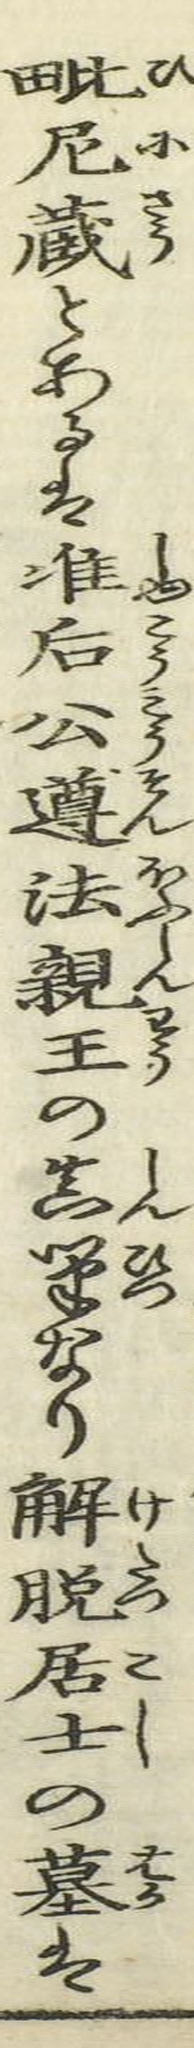毗尼蔵とあるは准后公遵法親王の真筆なり解脱居士の墓は
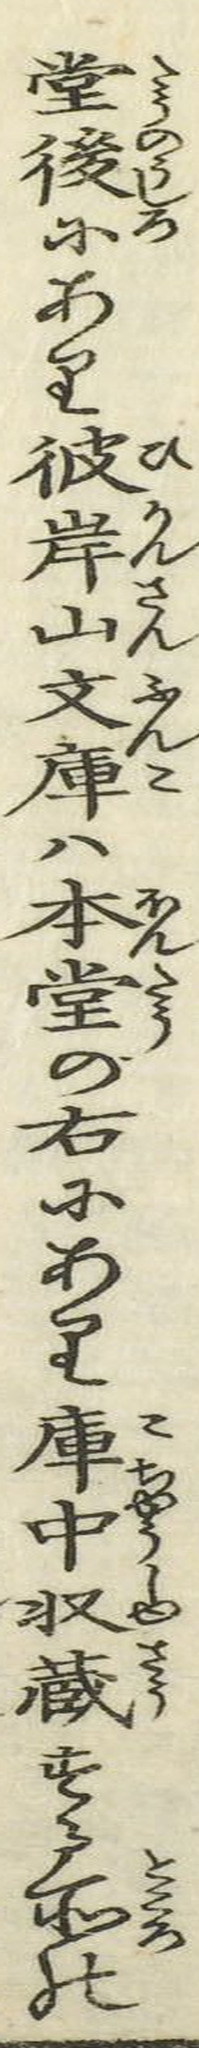堂後にあり彼岸山文庫は本堂の右にあり庫中収蔵する所の
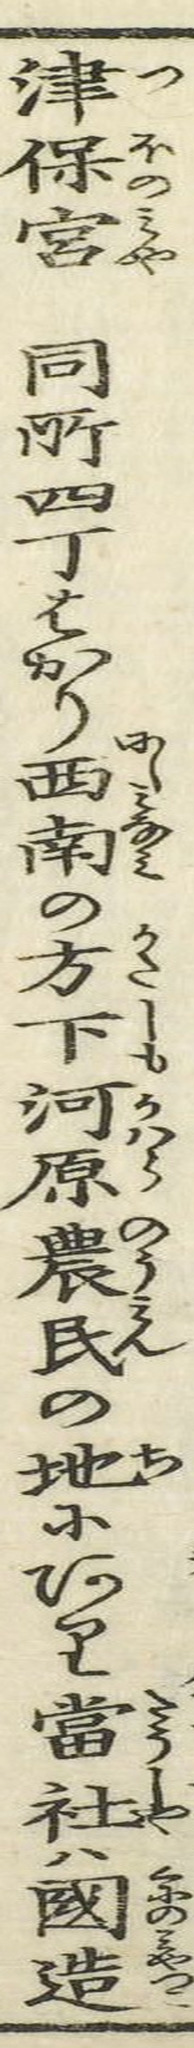津保宮同所四丁はかり西南の方下河原農民の地にあり当社は国造
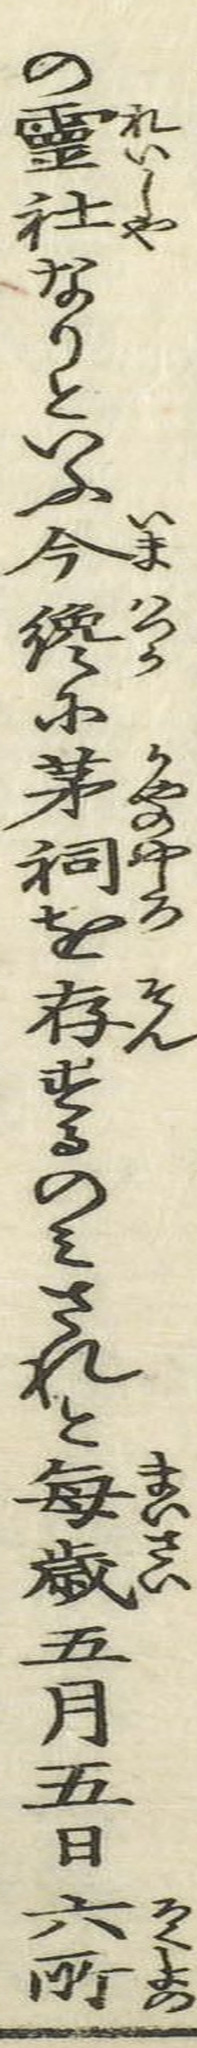の霊社なりといふ今纔に茅祠を存するのみされと毎歳五月五日六所
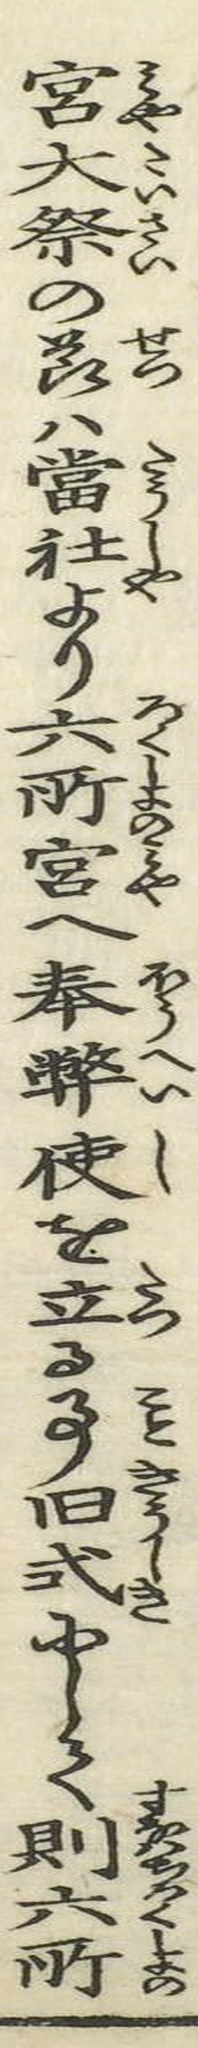宮大祭の節は当社より六所宮へ奉弊使を立る事旧式にして則六所
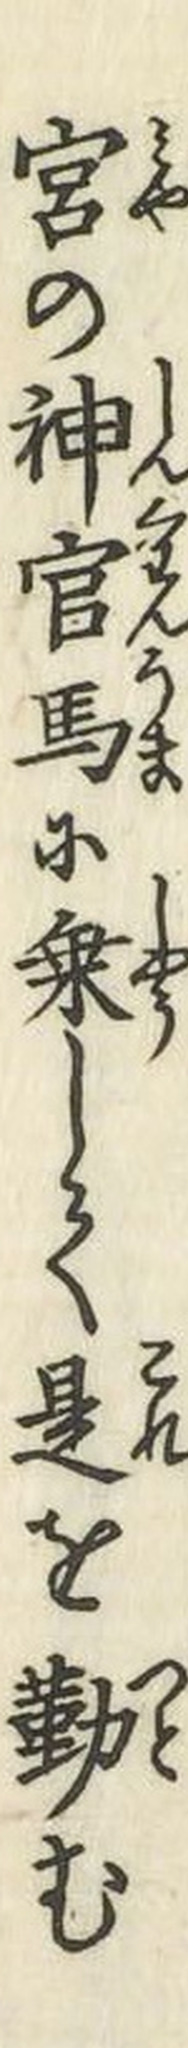宮の神官馬に乗して是を勤む
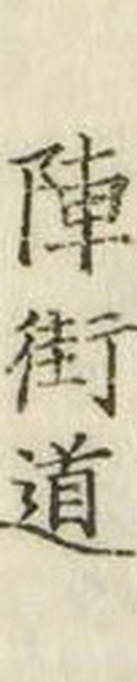陣街道

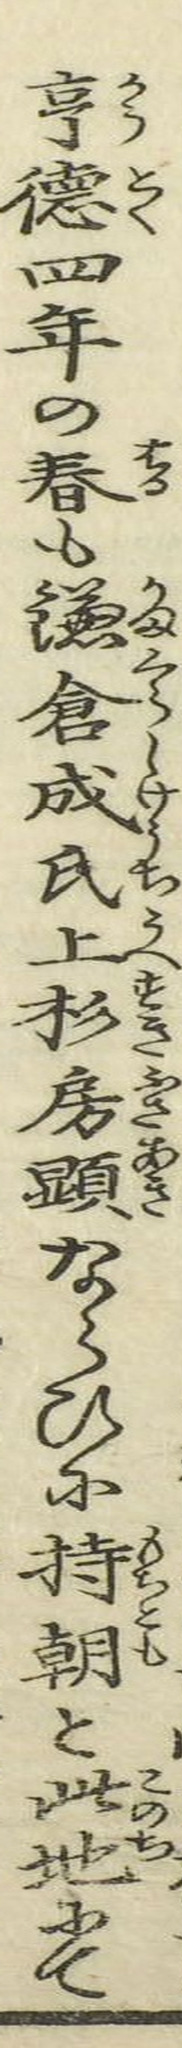享徳四年の春も鎌倉成氏上杉房顕ならひに持朝と此地にて
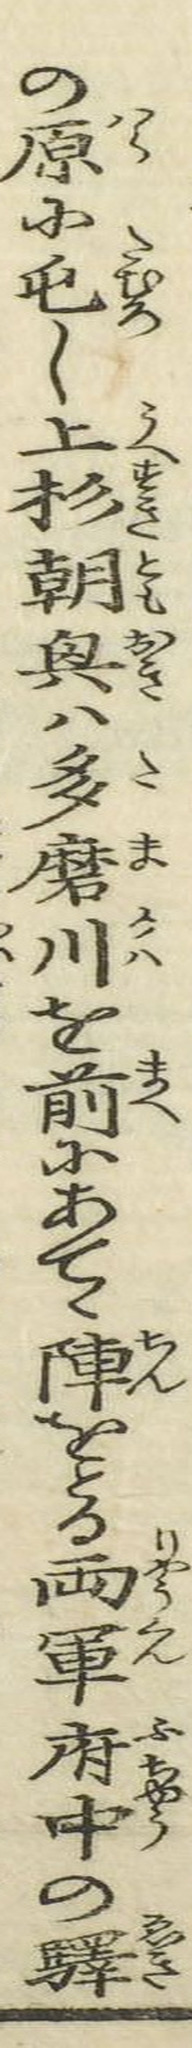の原に屯し上杉朝興は多磨川を前にあてゝ陣をとる両軍府中の駅
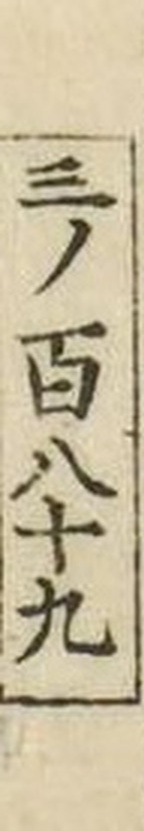三ノ百八十九
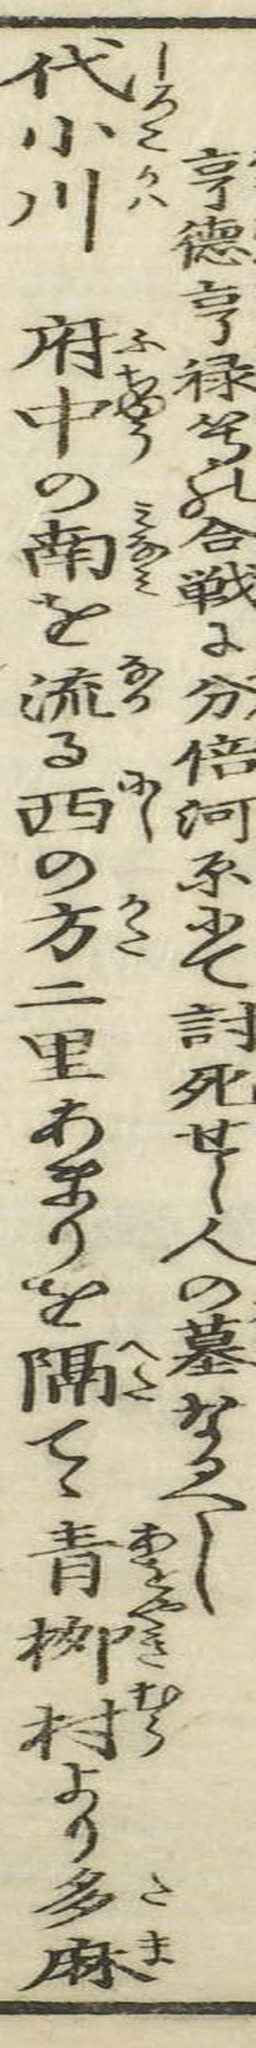代小川府中の南を流る西の方二里あまりを隔てゝ青柳村より多麻
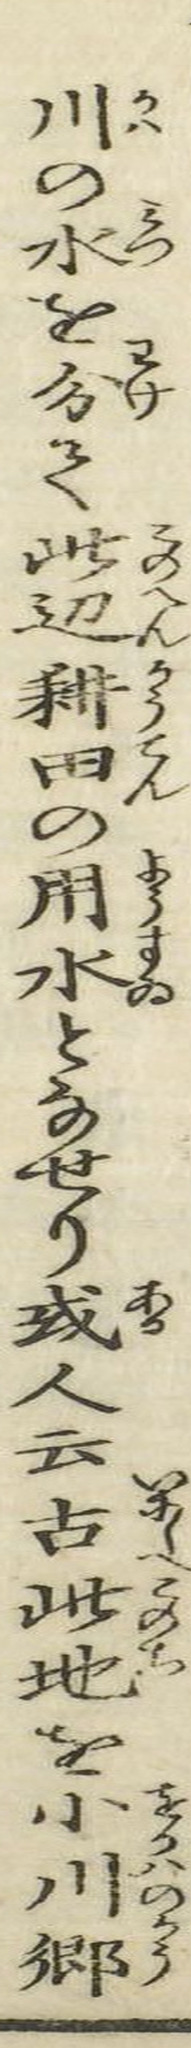川の水を分て此辺耕田の用水となせり或人云古此地を小川郷
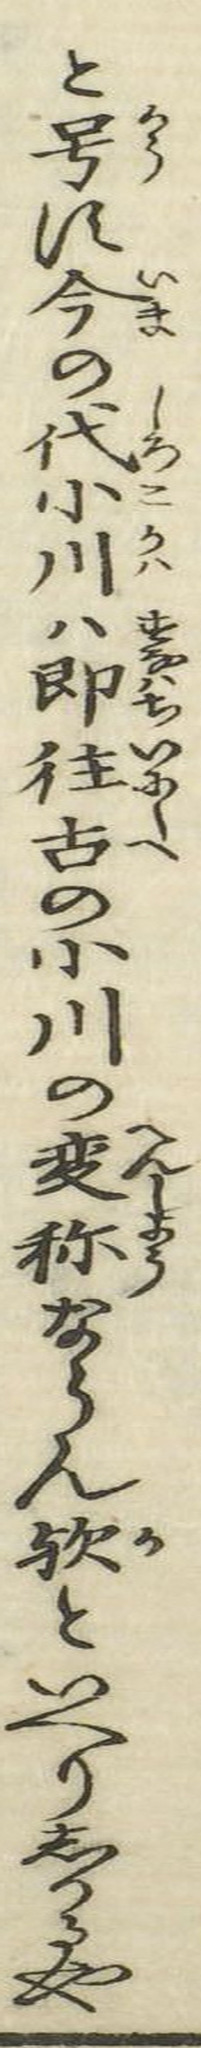と号す今の代小川は即徃古の小川の変称ならん歟といへりしかるや
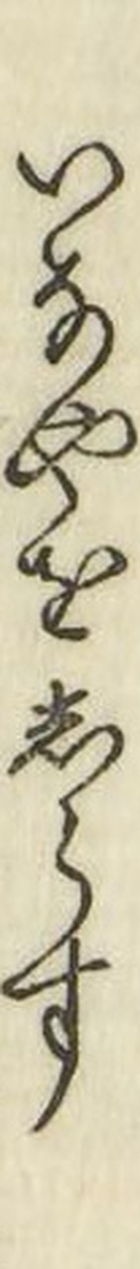いなやをしらす
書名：江戸名所図会 20巻 巻之10
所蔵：東京学芸大学教育コンテンツアーカイブ
